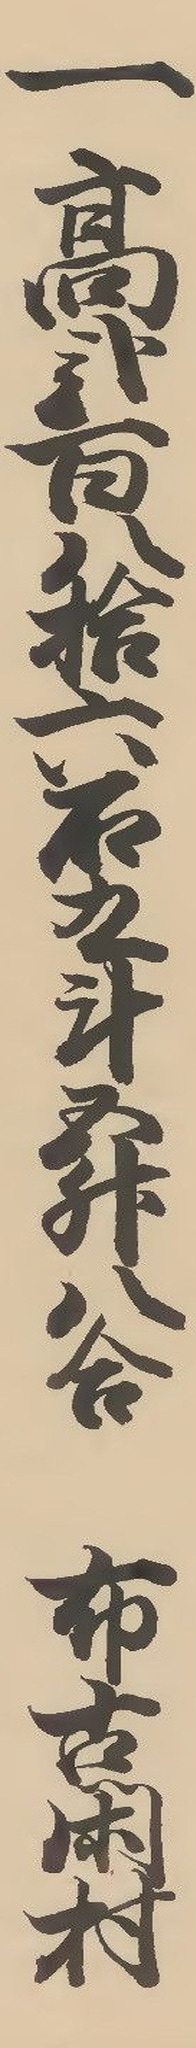一髙弐百八拾六石九斗五升八合布古閑村
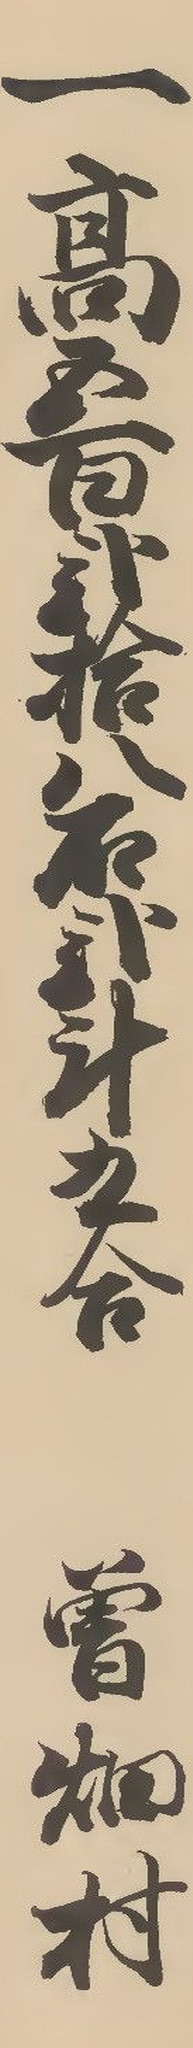一髙五百弐拾八石弐斗九合曽畑村
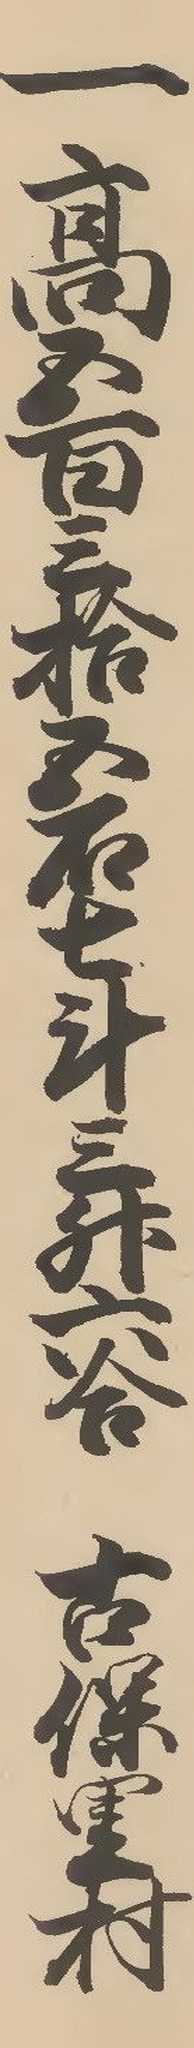一髙五百三拾五石七斗三升六合古保里村
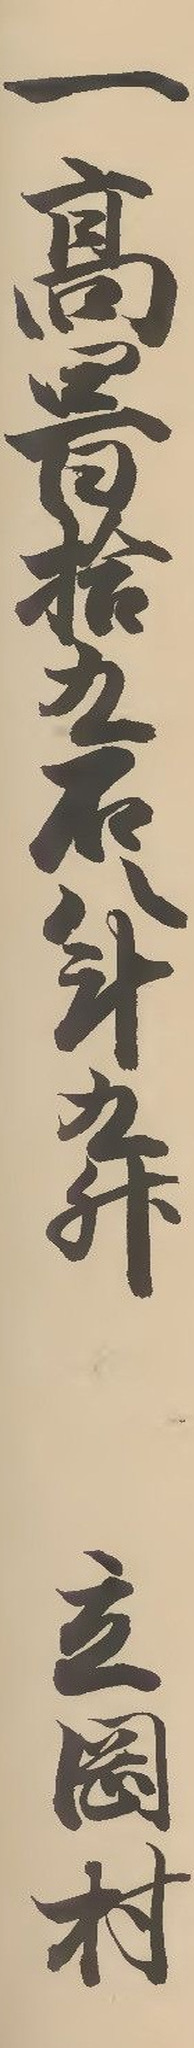一髙四百拾九石八斗九升立岡村
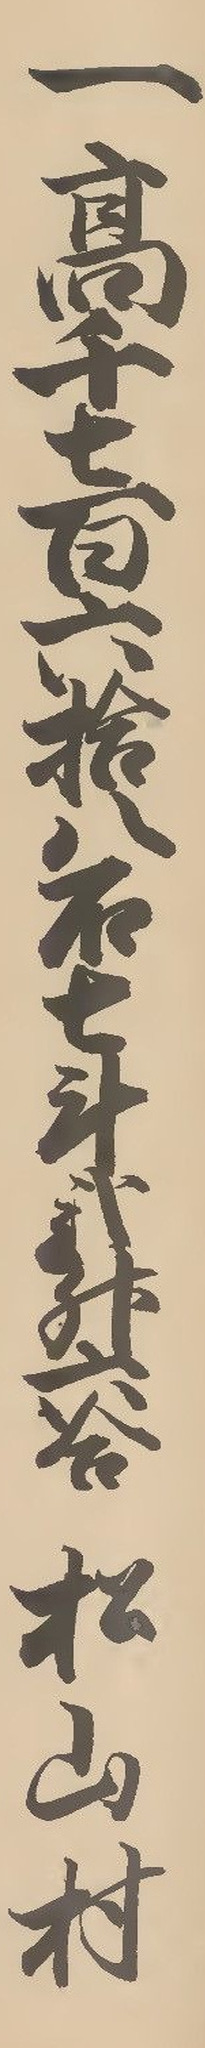一髙千七百六拾八石七斗弐升六合松山村
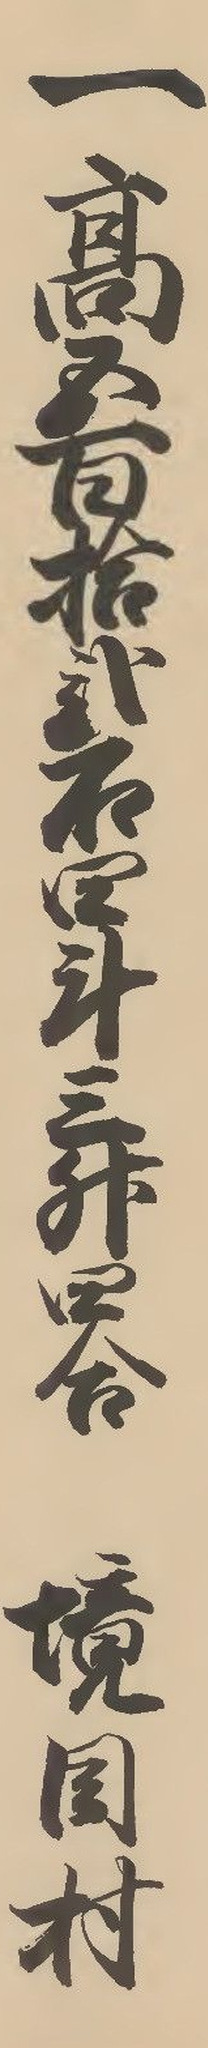一髙五百拾弐石四斗三升四合境目村
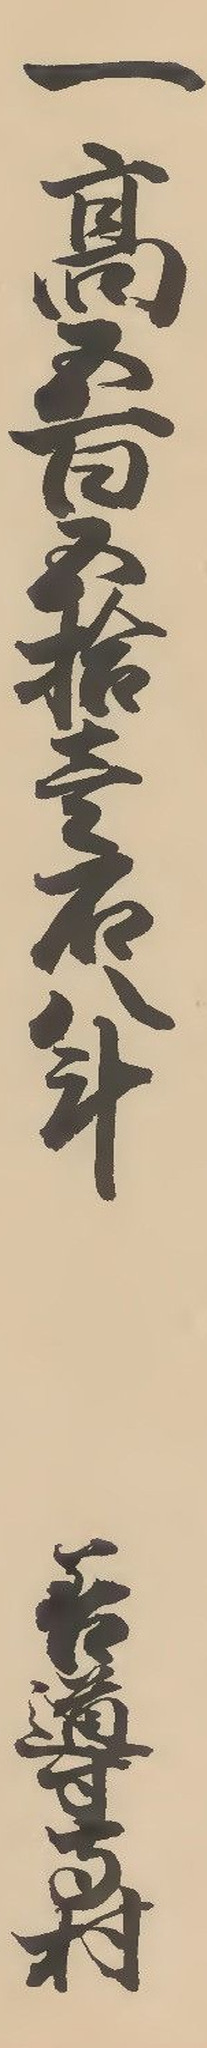一髙五百五拾壱石八斗善導寺村
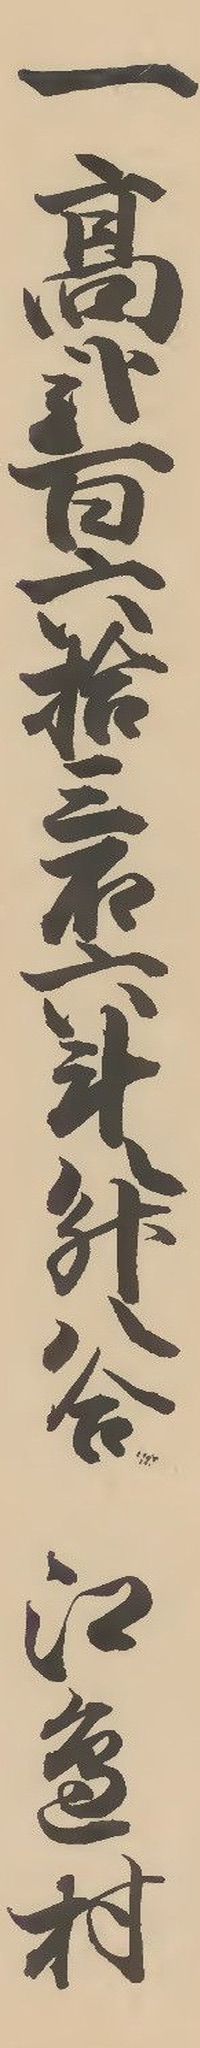一髙弐百六拾三石六斗八升八合江邊村

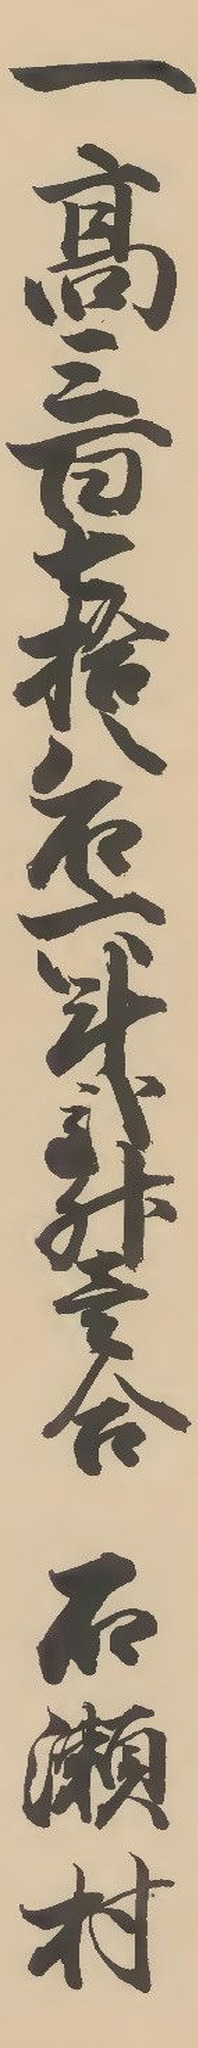一髙三百七拾八石六斗弐升壱合石瀬村
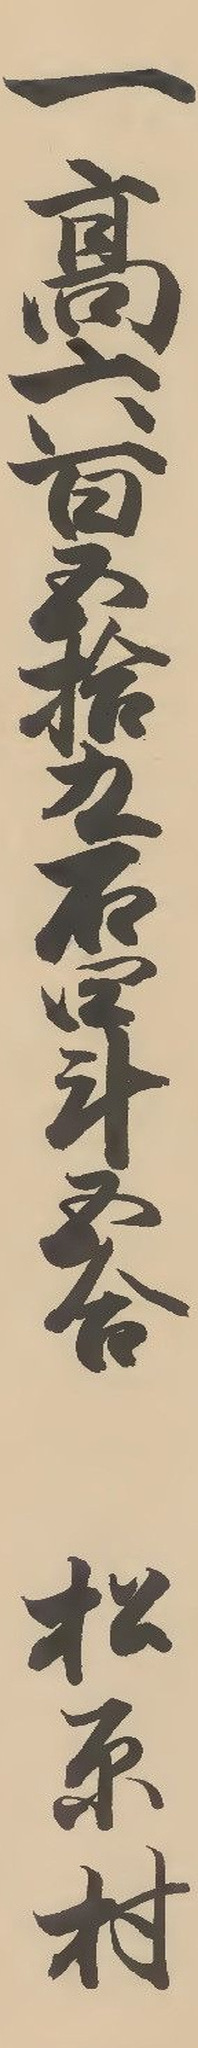一髙六百五拾九石四斗五合松原村
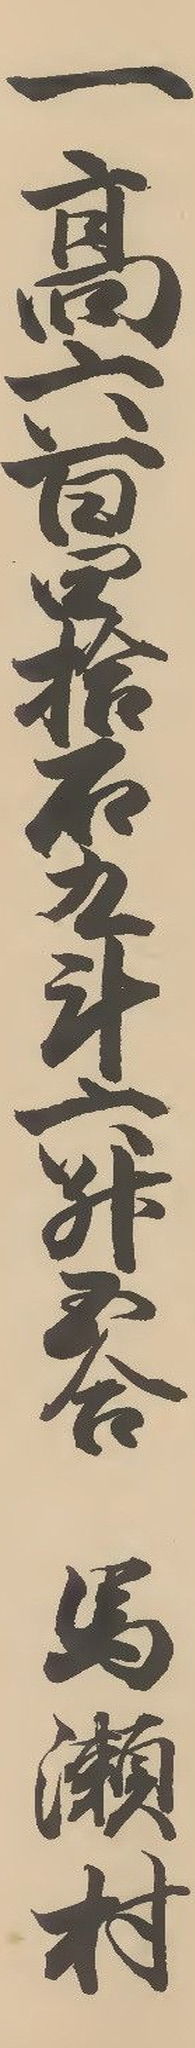一髙六百四拾石九斗六升五合馬瀬村
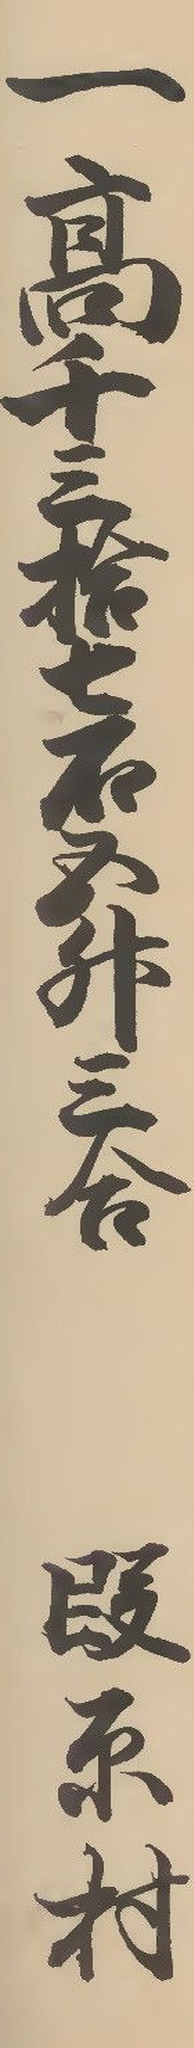一髙千三拾七石五升三合段原村
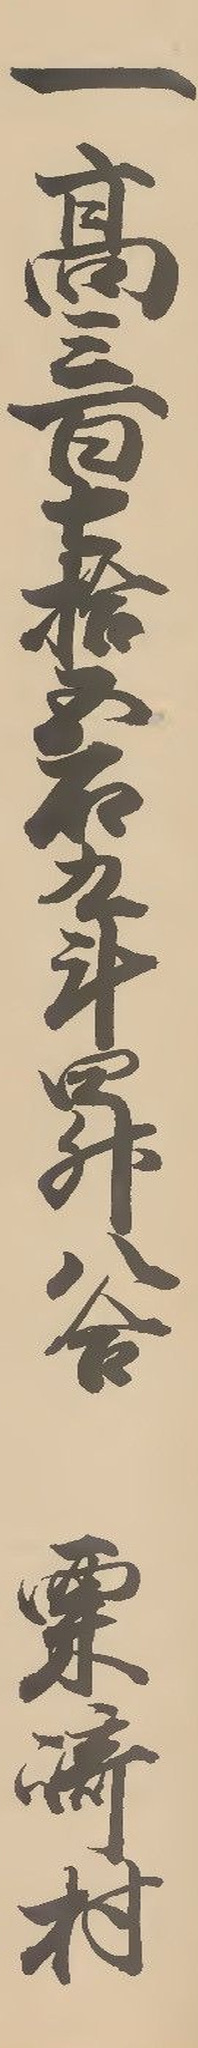一髙三百七拾五石九斗四升八合栗崎村
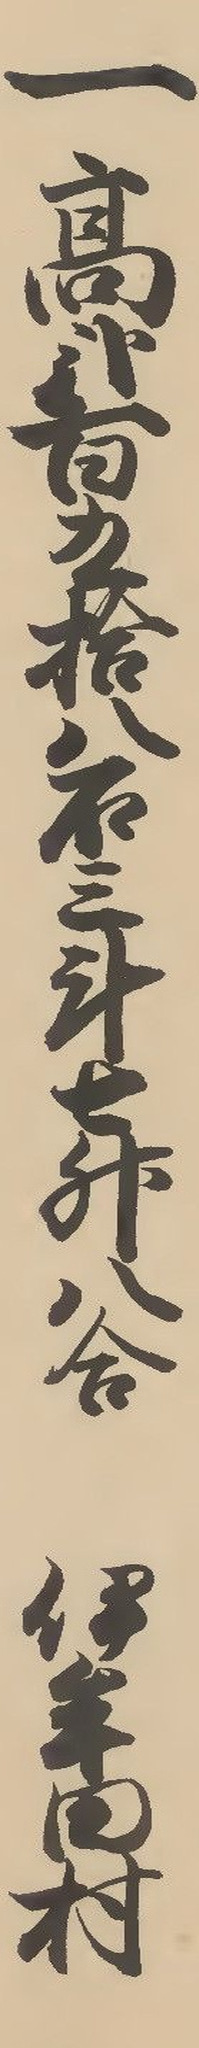一髙弐百九拾八石三斗七升八合伊牟田村
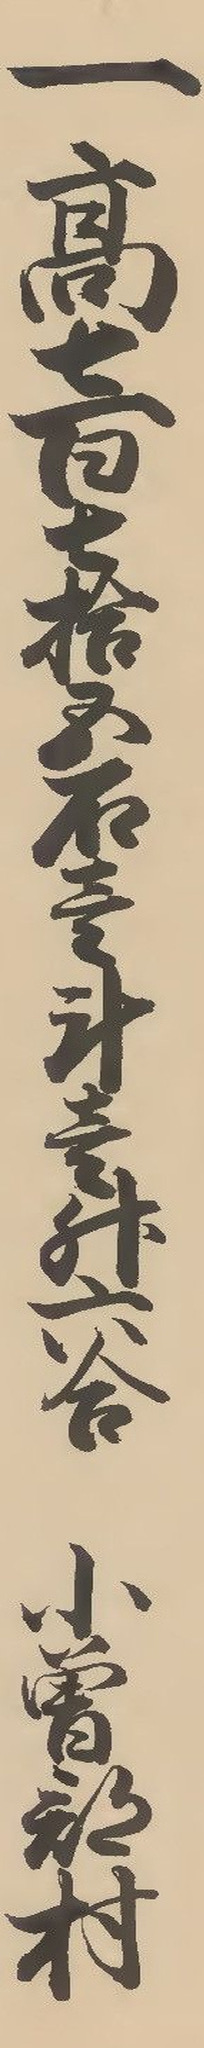一髙七百七拾五石壱斗壱升六合小曽部村
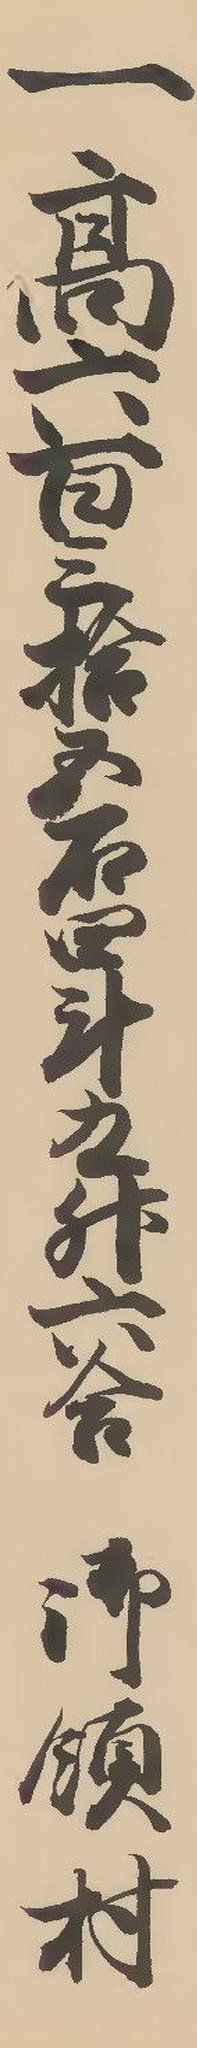一髙六百三拾五石四斗九升六合御領村
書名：肥後国郷帳
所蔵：国立公文書館 National Archives of Japan
